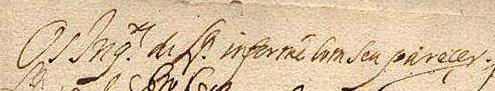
Os Inq.res de Lx.a informē com seu parecer.
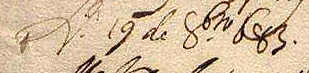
Lx.a 19 de 8.bro 683.
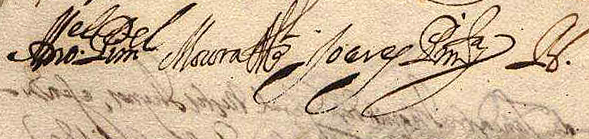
Mno.el Pimel Moura Mel Soares Pimta
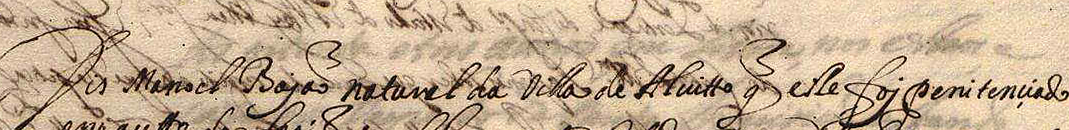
Diz Manoel Bajaõ natural da Villa de Aluito q̄ elle foy penitenciado
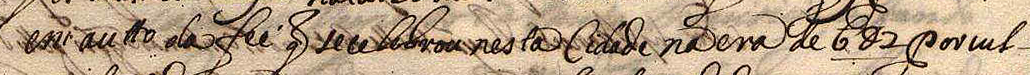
en autto da feé q̄ se celebrou nesta Cidade na era de 682 por cul
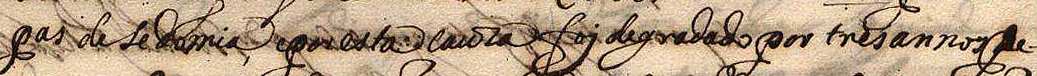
pas de sedomia, e por esta cauza foj degradado por tres annos pe
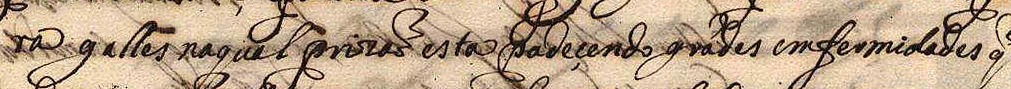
ra galles na qual prizaõ esta padecendo grādes emfermidades q̄
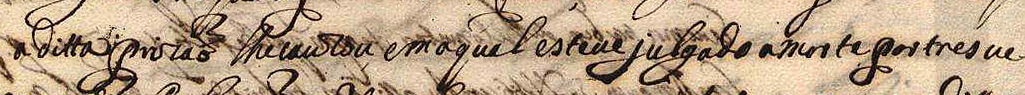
a ditta prizaõ lhe cauzou em a qual esteue julgado a morte por tres ue
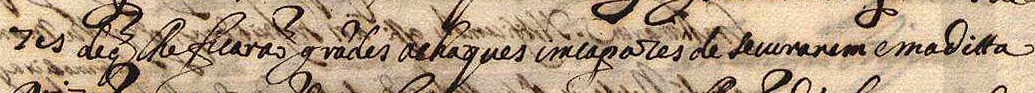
zes de q̄ lhe ficaraõ grādes achaques imcapazes de se curarem em a ditta
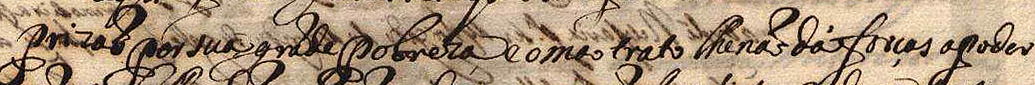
prizaõ por sua grāde pobreza, e o mao trato lhe não dá forças a poder
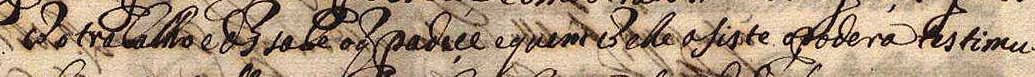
cō o trabalho e ds̄ sabe o q̄ padece e quem cō elle asiste o podera testimu
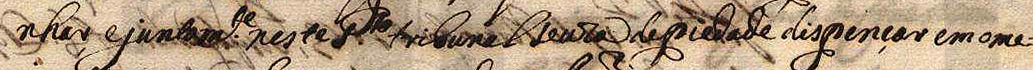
nhar e juntam.te neste s.to tribunal se uza de piedade dispençar em o me
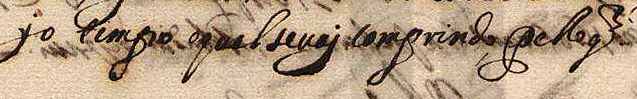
yo tempo o qual se uaj comprindo pello q̄
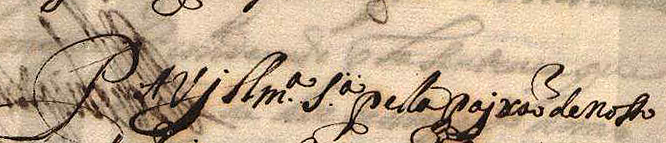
P A V Jllm.a S.a pella pajxaõ de nosso
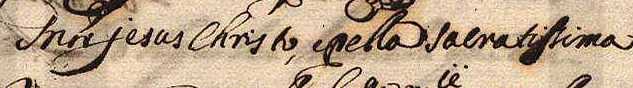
Snor̄ Jesus Christo, e pella sacratissima
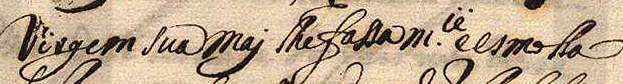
Virgem sua maj lhe fassa m.ce e esmolla
